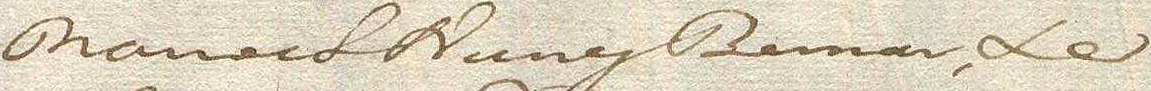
Manoel Nunes Bemar, se
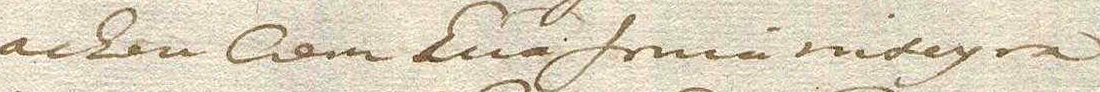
achou com hua Jrmã inteyra
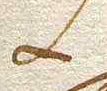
L
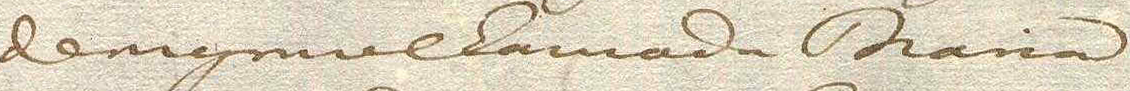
do mesmo chamada Maria
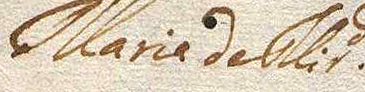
Maria de Mir.da
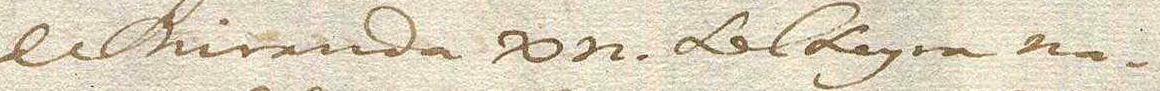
de Miranda x n. solteyra na
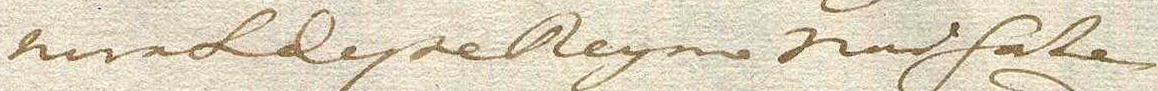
tural deste Reyno naõ sabe
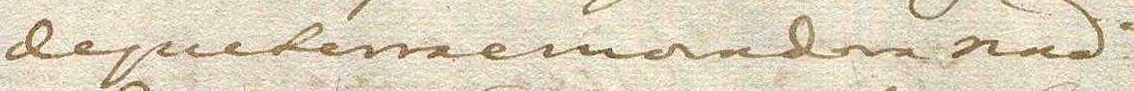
de que terra e moradora na d.a
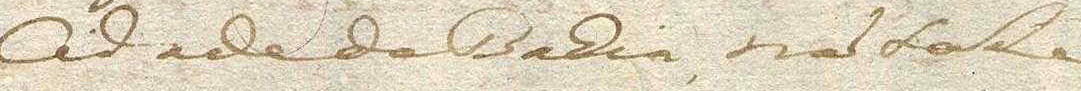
cidade da Bahia, naõ sabe
